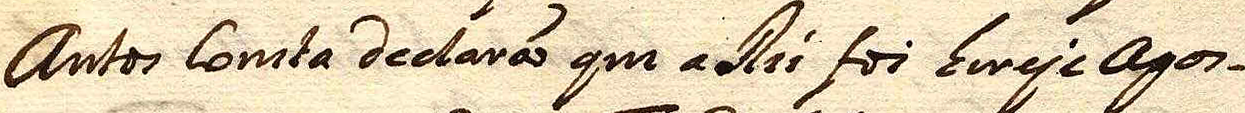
Autos Consta declarão que a Reé foi hereje Apos
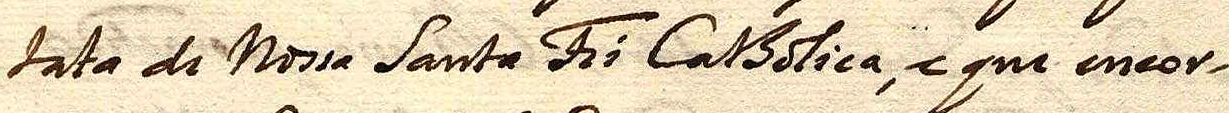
tata da Nossa Santa Feé Catholica, e que encor
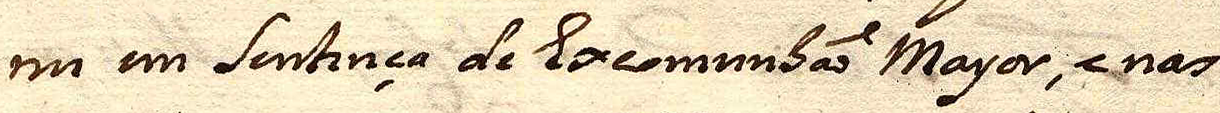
reu em Sentença de Excomunhaõ Mayor, e nas
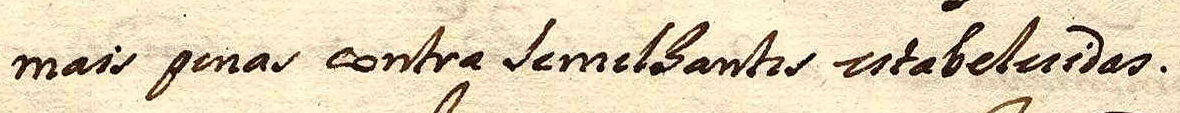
mais penas contra Semelhantes estabelesidas.
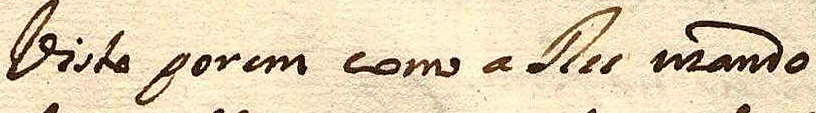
Visto porem como a Ree uzando
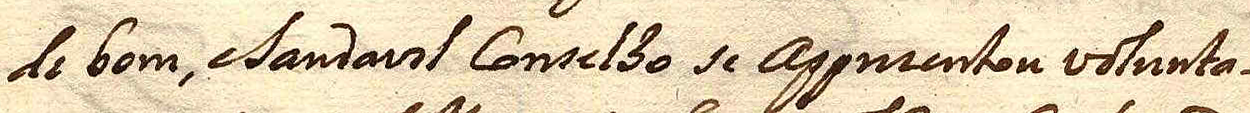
de bom, e Saudavel Conselho se Apprezentou volunta
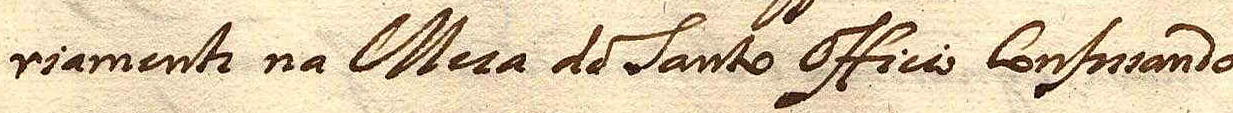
riamente na Meza do Santo Officio Confessando
